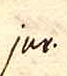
jur.
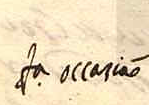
d̄a. occaziaõ
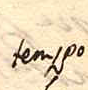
tempo
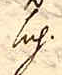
lug.
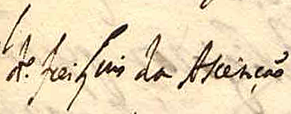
d̄.o frei Luis da Ascençaõ
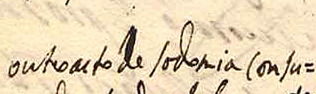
outro acto de sodomia consu
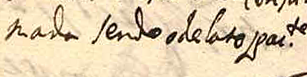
mada sendo o delato pac.te
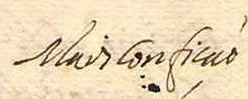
Mais Confiçaõ
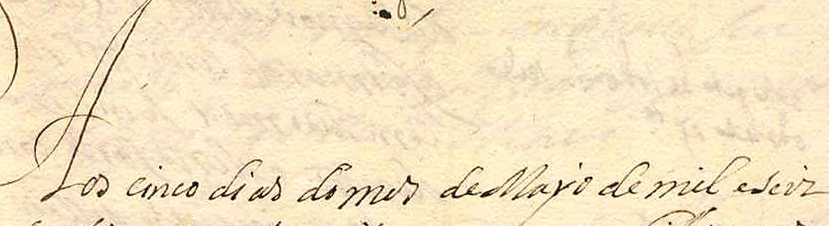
Aos cinco dias do mes de Mayo de mil e seis
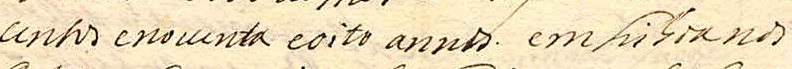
centos e nouenta e oito annos. em Lisboa nos
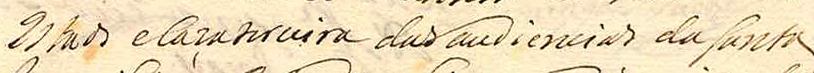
Estaos e Caza terceira das audiencias da santa
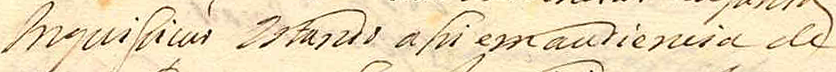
Inquisição estando ahi em audiencia de
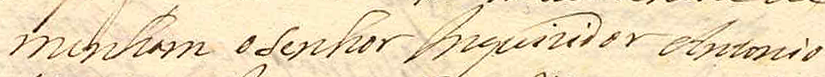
menham o senhor Inquizidor Antonio
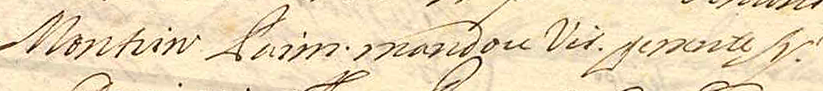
Monteiro Paim. mandou Vir perante sy.
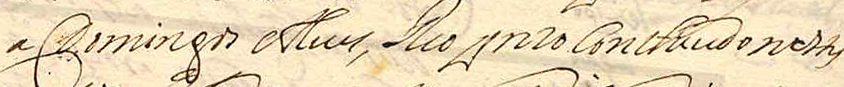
a Domingos Alues, Reo prezo Contheudo nestes
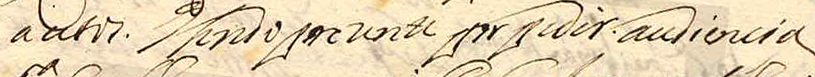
autos. E Sendo prezente por pedir audiencia
